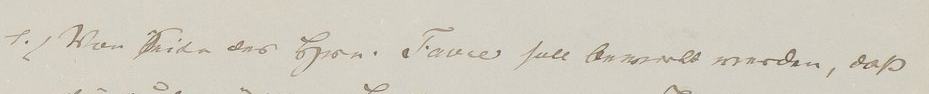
1.) Von Seite des Hrn. Favre soll bewirkt werden, daß
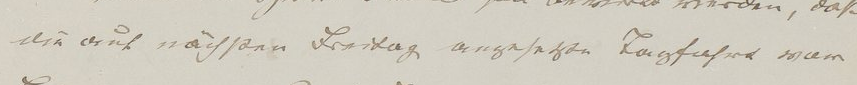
die auf nächsten Freitag angesetzte Tagfahrt vor
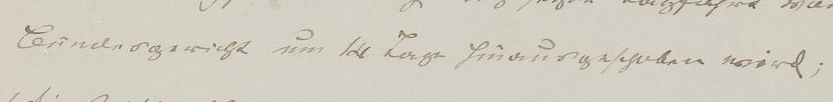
Bundesgericht um 14 Tage hinausgeschoben wird;
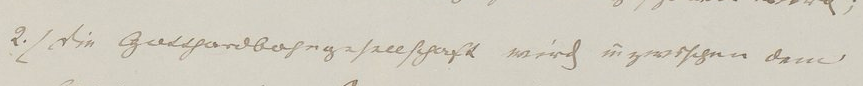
2.) Die Gotthardbahngesellschaft wird inzwischen dem
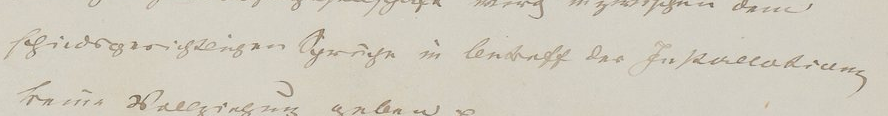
schiedsgerichtlichen Spruche in Betreff der Installationen
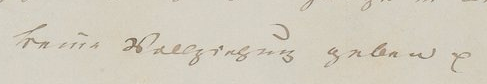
keine Vollziehung geben u.
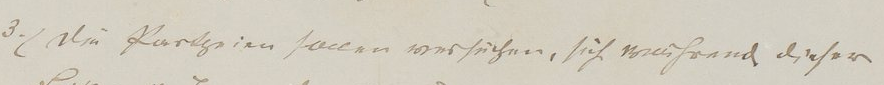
3.) Die Partheien sollen versuchen, sich während dieser
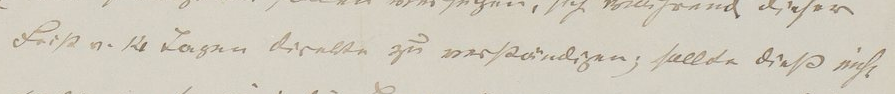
Frist v. 14 Tagen direkte zu verständigen; sollte dieß nicht
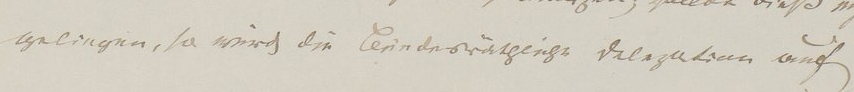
gelingen, so würde die Bundesräthliche Delegation auf
